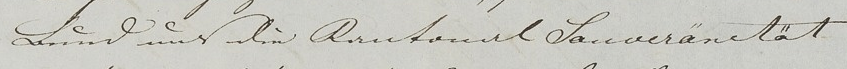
Bund uns die Kantonal Souveränetät
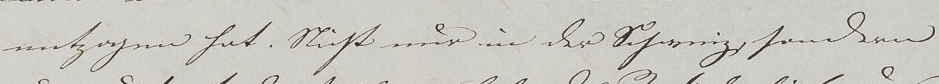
entzogen hat. Nicht nur in der Schweiz, sondern
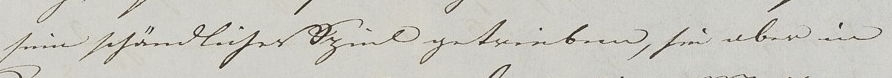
sein schändliches Spiel getrieben, sei aber in
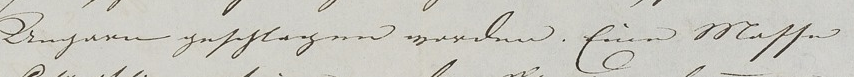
Ungarn geschlagen worden. Eine Masse
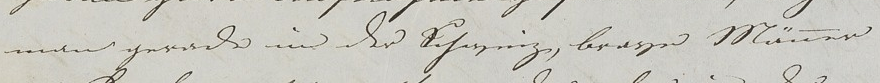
man gerade in der Schweiz, brave Männer
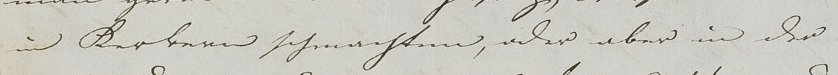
in Kerkern schmachten, oder aber in der
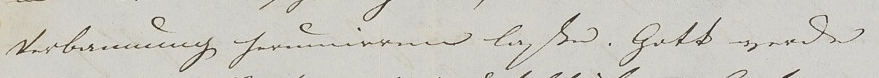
Verbannung herumirren laße. Gott werde
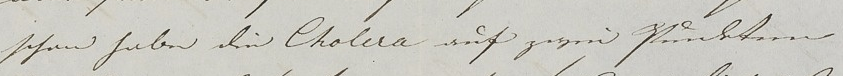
schon habe die Cholera auf zwei Punkten
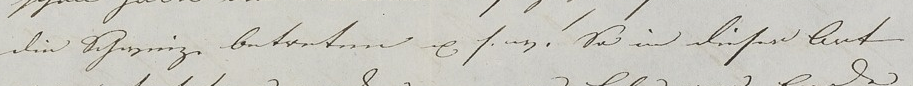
die Schweiz betreten &s. w! So in dieser Art
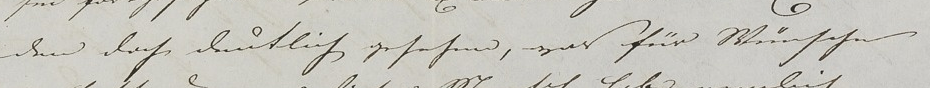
dan doch deutlich gesehen, was für Wünsche
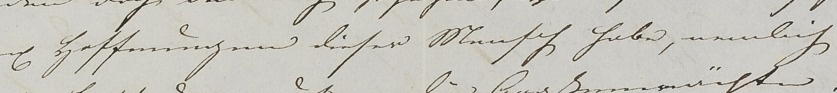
& Hoffnungen dieser Mensch habe, nemlich
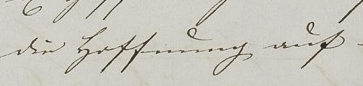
die Hoffnung auf –
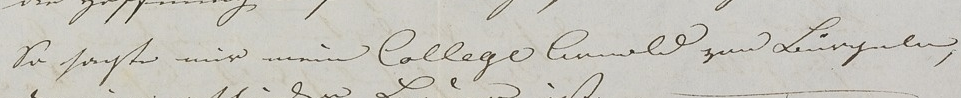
So sagte mir mein College Arnold von Bürgeln,
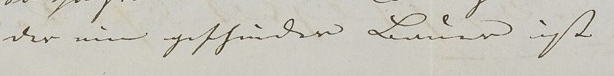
der ein gescheider Bauer ist. –
